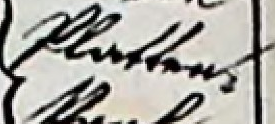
Platten„
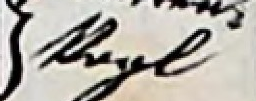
kogl
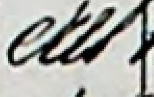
Alt
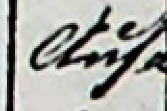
Aus„
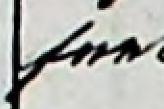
see
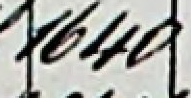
1640
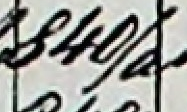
840/a
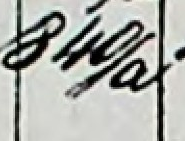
840/a
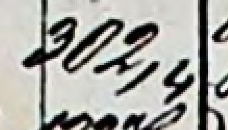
302,4
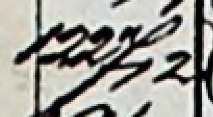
1227,2
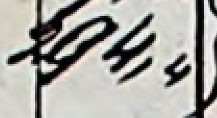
294,4
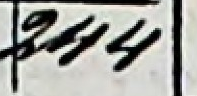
244
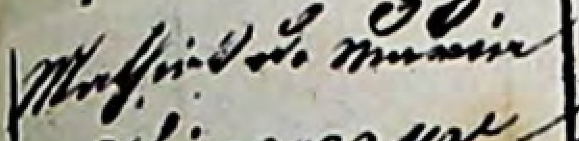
Mathias u. Maria
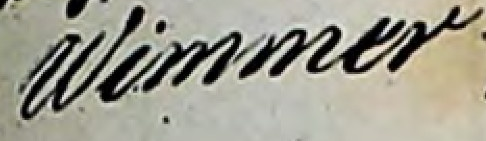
Wimmer
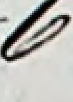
6
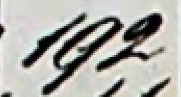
192
